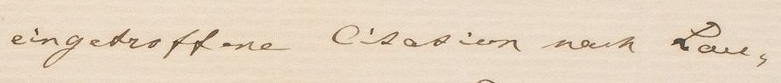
eingetroffene Citation nach Lau-
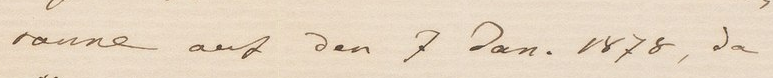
sanne auf den 7 Jan. 1878, da
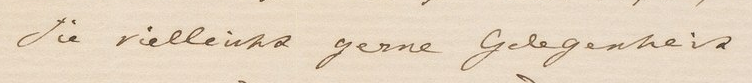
Sie vielleicht gerne Gelegenheit
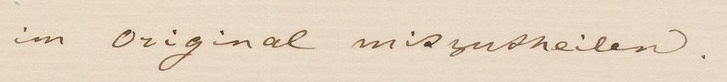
im Original mitzutheilen.
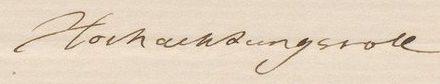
Hochachtungsvoll
